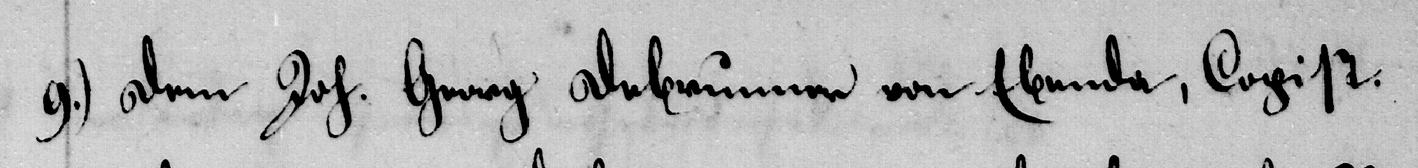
9.) Dem Joh. Georg Debrunner von Ebenda, Copist.
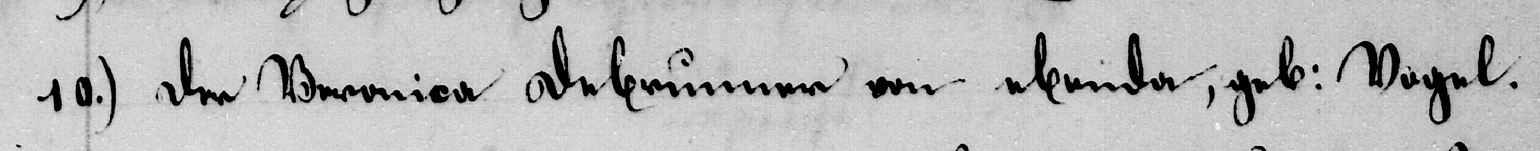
10.) Der Veronica Debrunner von ebenda, geb: Vogel.
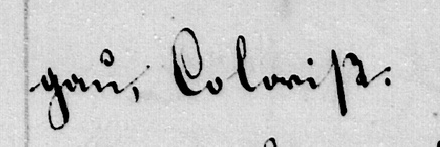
gau, Colorist.
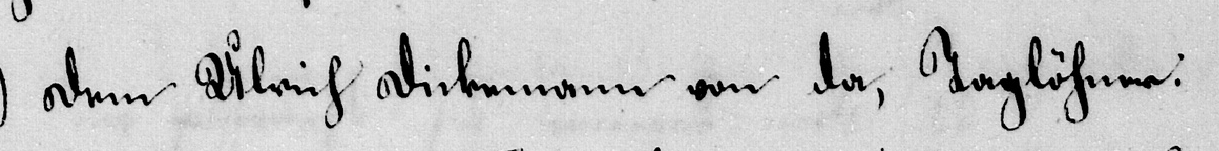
Dem Ulrich Dickemann von da, Taglöhner.
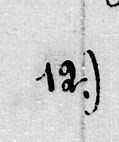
12.)
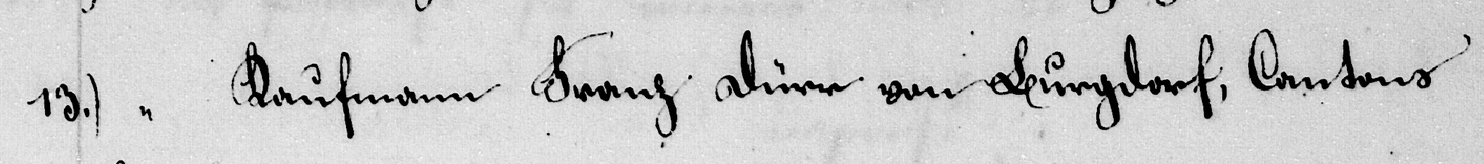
13.) “ Kaufmann Franz Dürr von Burgdorf, Cantons
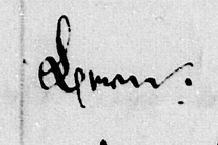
Bern.
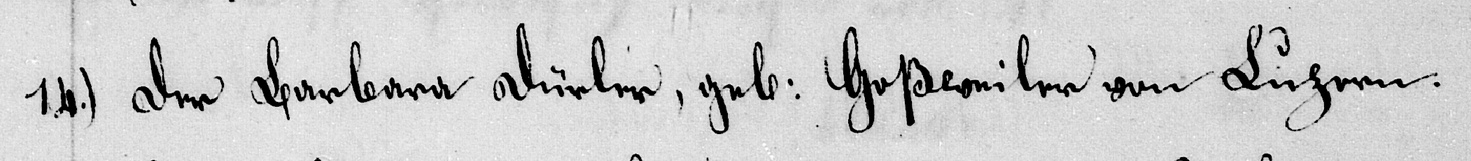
14.) Der Barbara Dürler, geb: Goßweiler von Luzern.
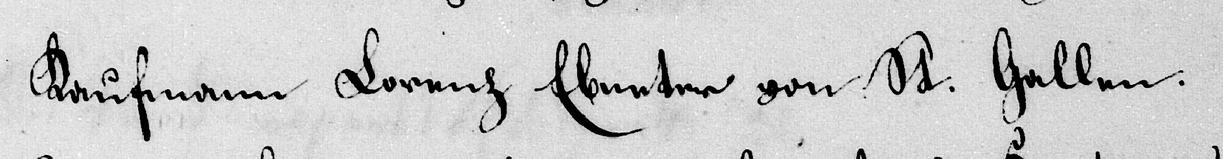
Kaufmann Lorenz Ebneter von St. Gallen.
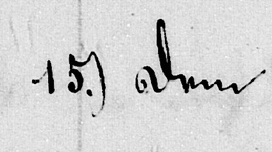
15.) Dem
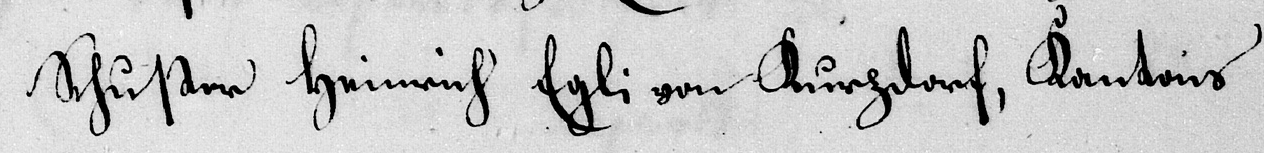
Schuster Heinrich Egli von Kurzdorf, Kantons
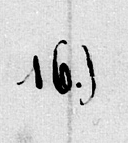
16.)
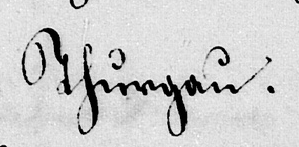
Thurgau.
